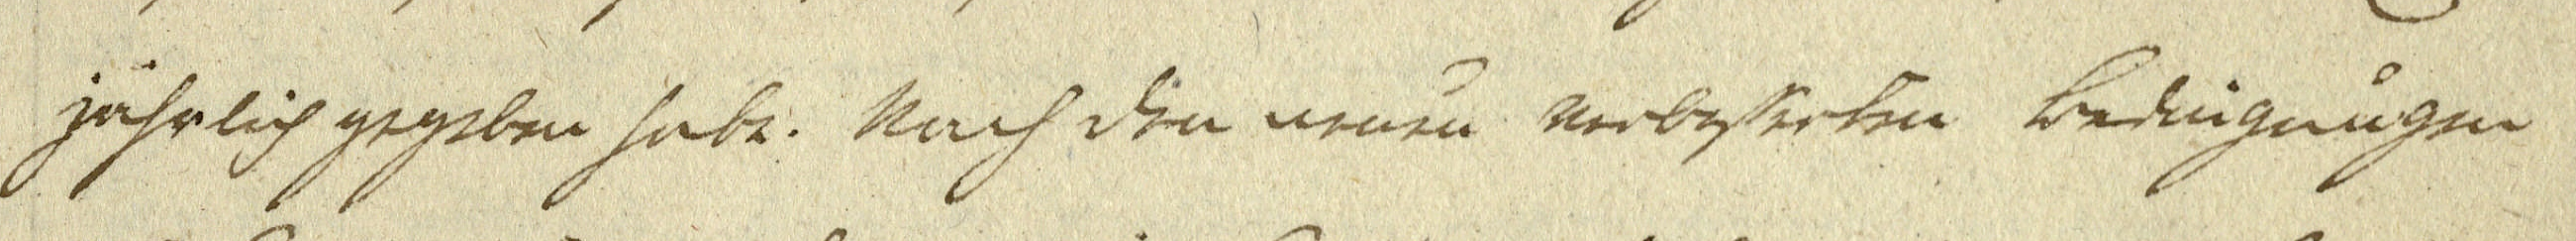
jährlich gegeben habe. Nach den neuen verbesserten Bedingungen
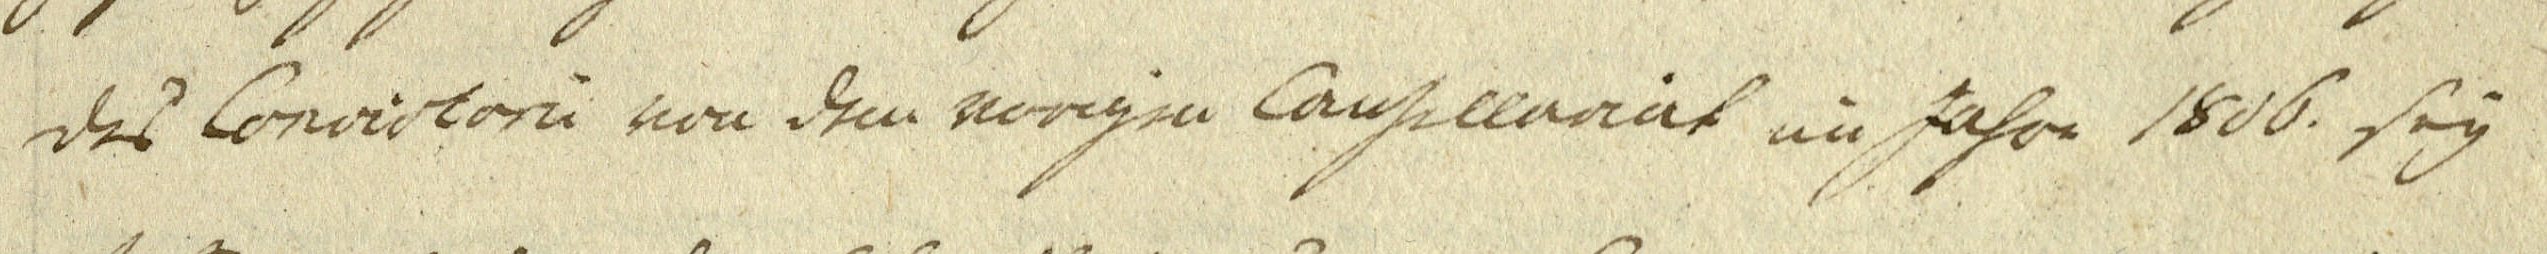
des Convictorii von dem vorigen Canzellariat im Jahre 1806. seÿ
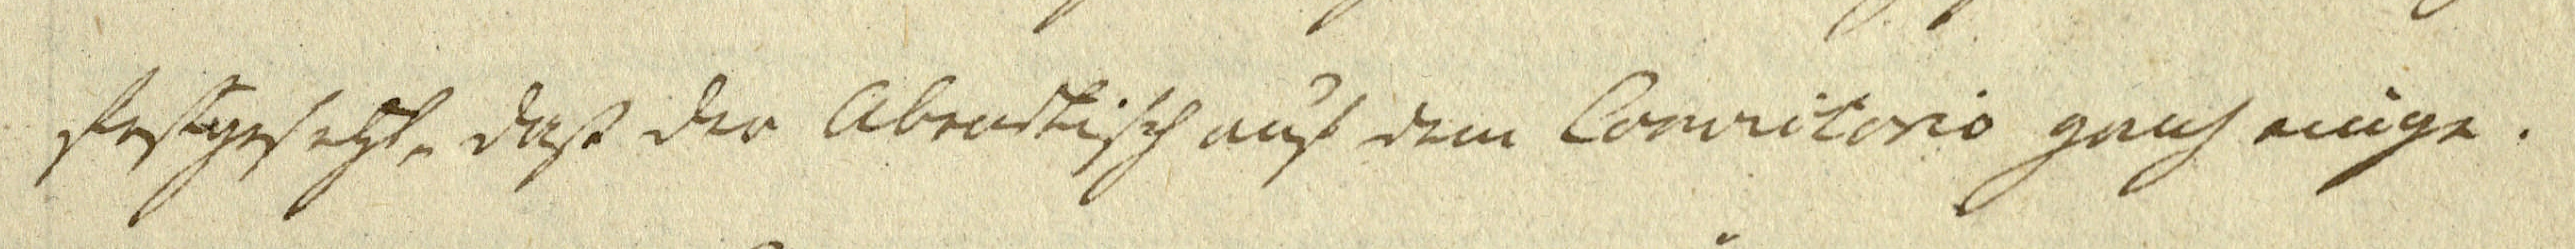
festgesetzt, daß der Abendtisch auf dem Convictorio ganz einge¬
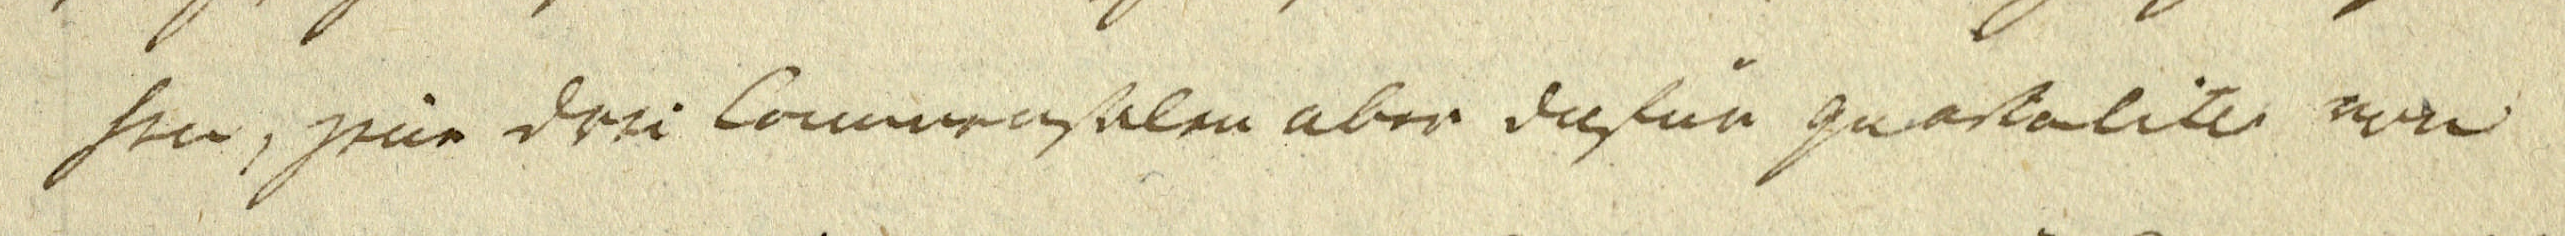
hen, jene drei Commensalen aber dafür quartaliter von
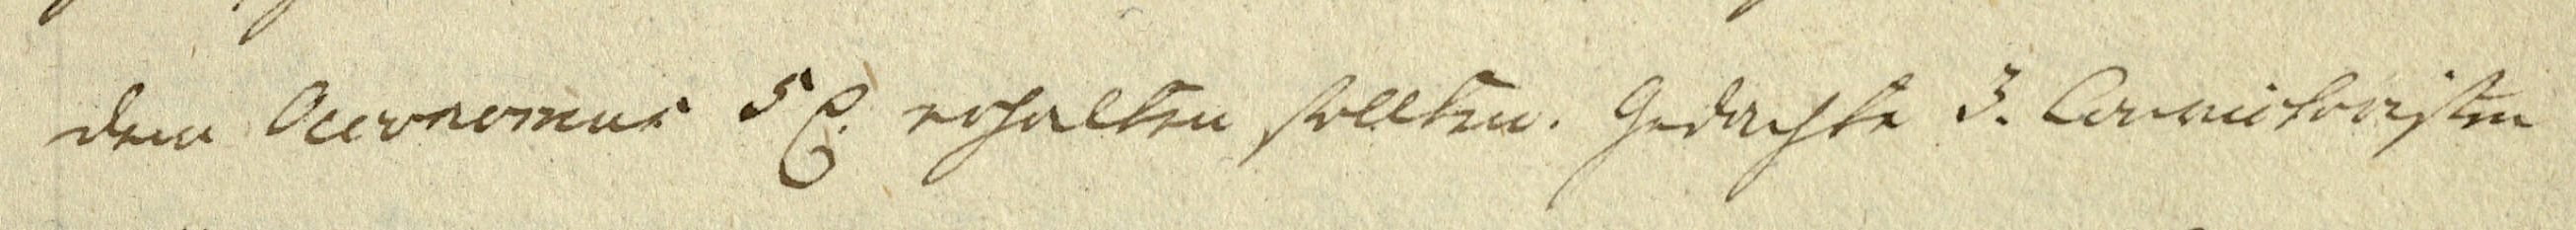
dem Oeconomus 5 l. erhalten sollten. Gedachte 3. Convictoristen
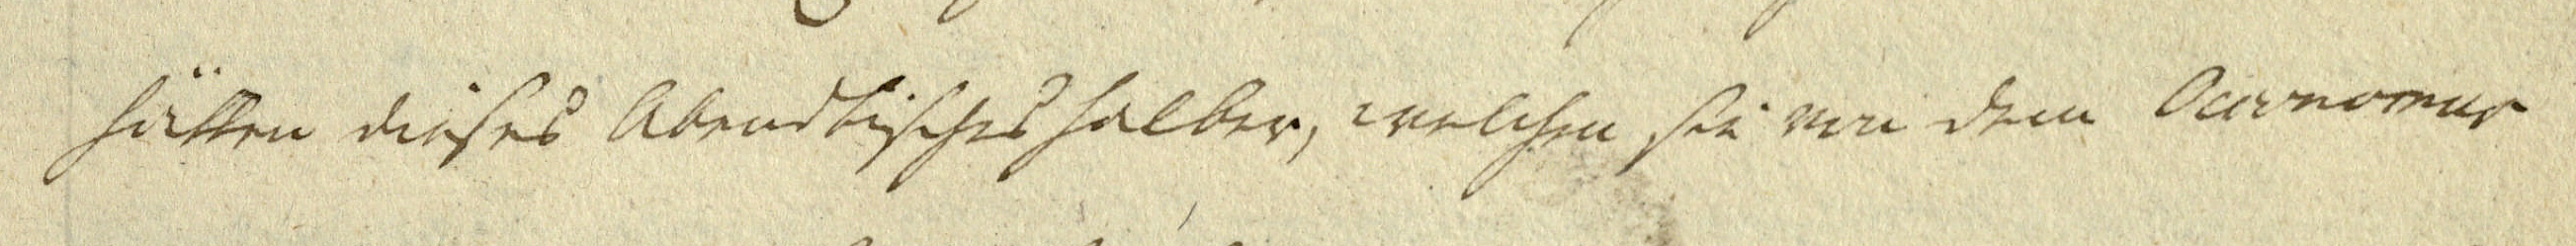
hätten dieses Abendtisches halber, welchen sie von dem Oeconomus
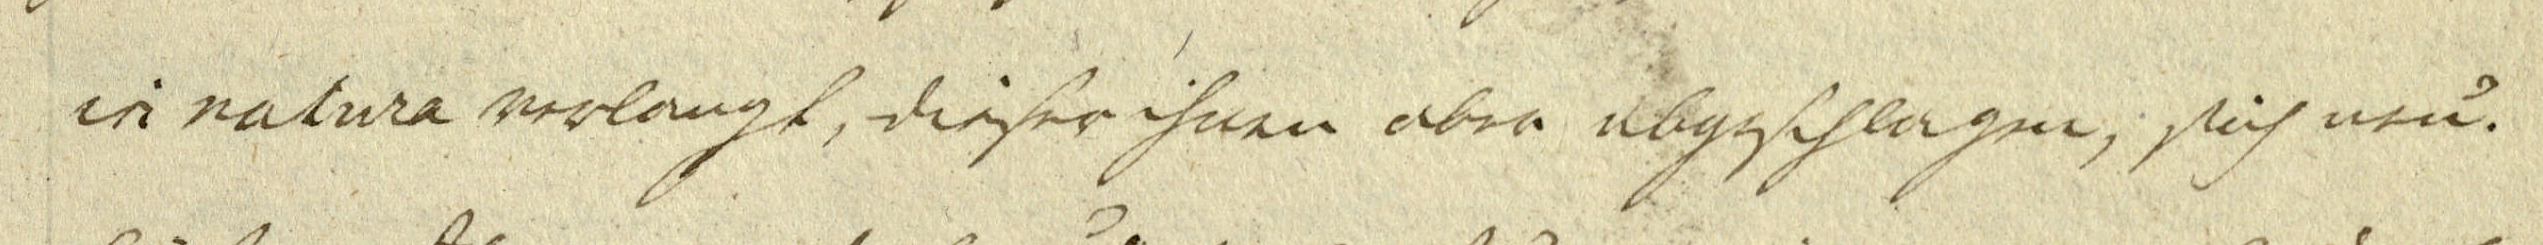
in natura verlangt, dieser ihnen aber abgeschlagen, sich neu¬
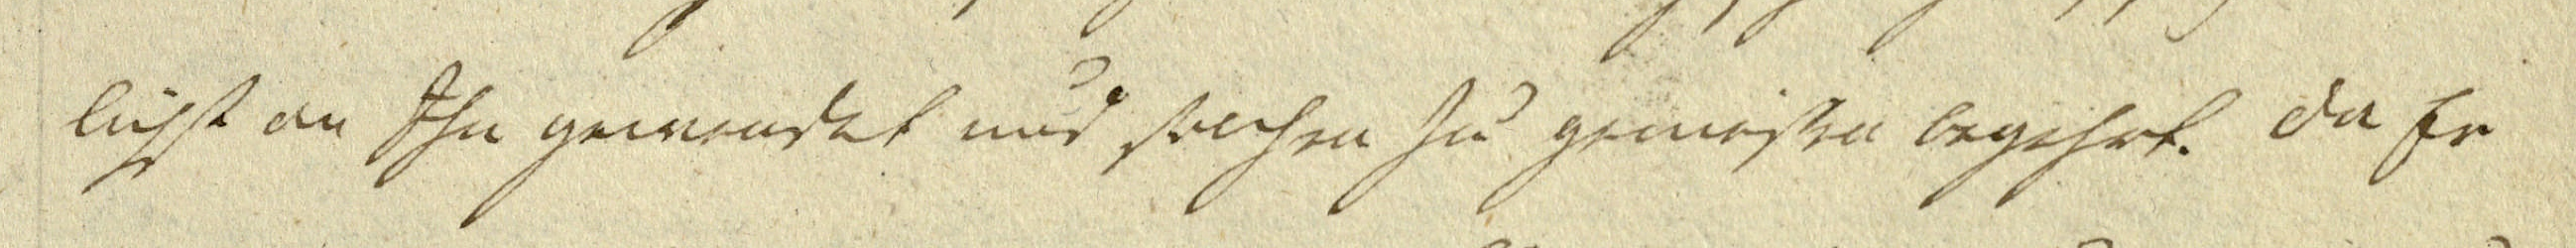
lichst an Ihn gewendet und solchen zu geniessen begehrt. Da Er
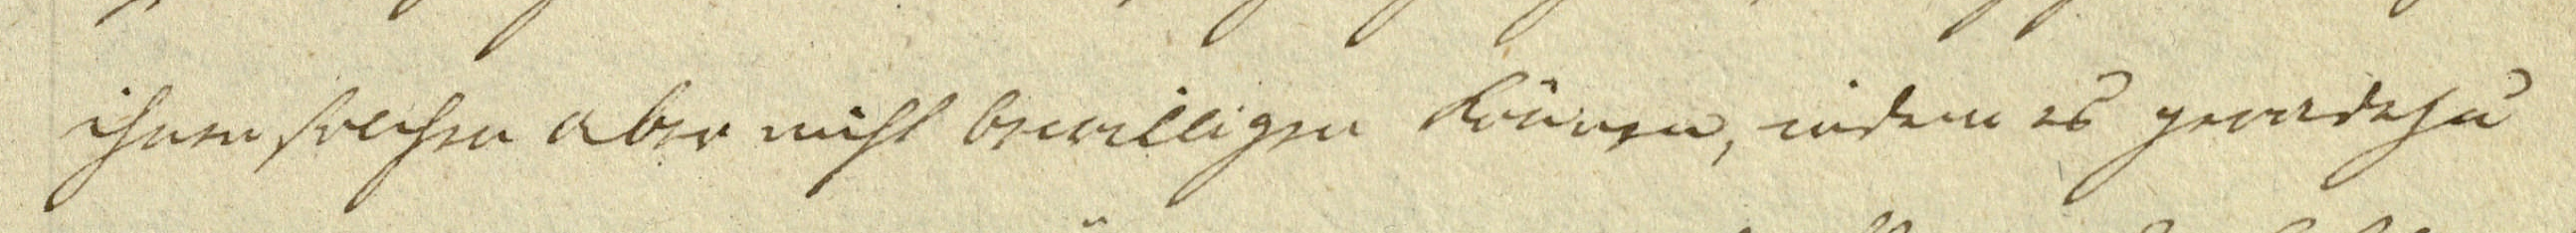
ihnen solchen aber nicht bewilligen können, indem es geradezu
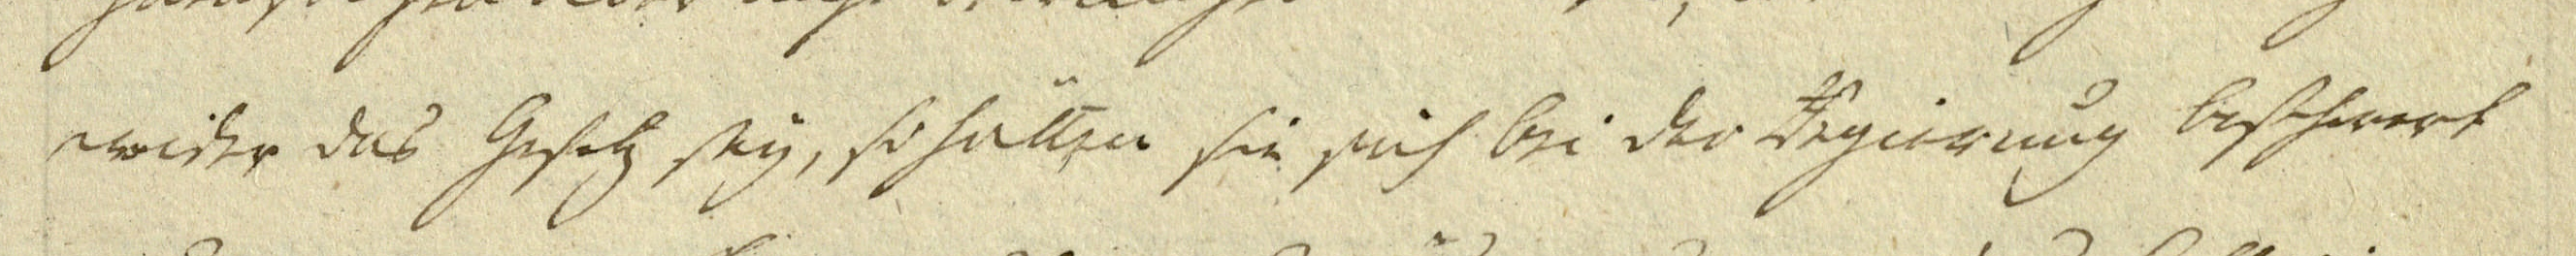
wider das Gesetz seÿ, so hätten sie sich bei der Regierung beschwert
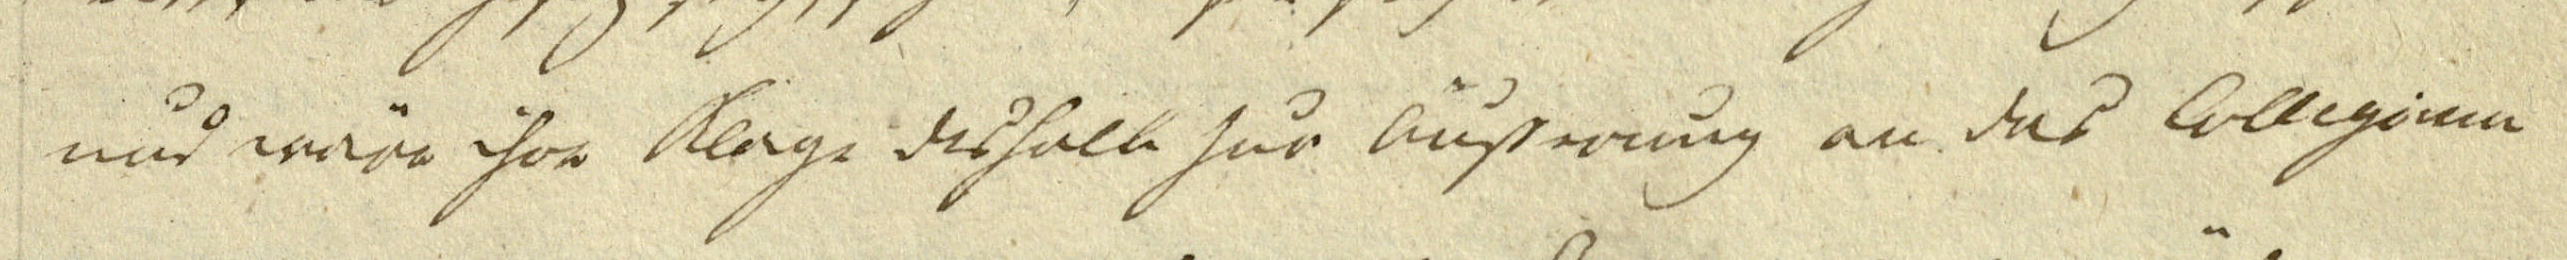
und wäre ihre Klage deshalb zur Äusserung an das Collegium
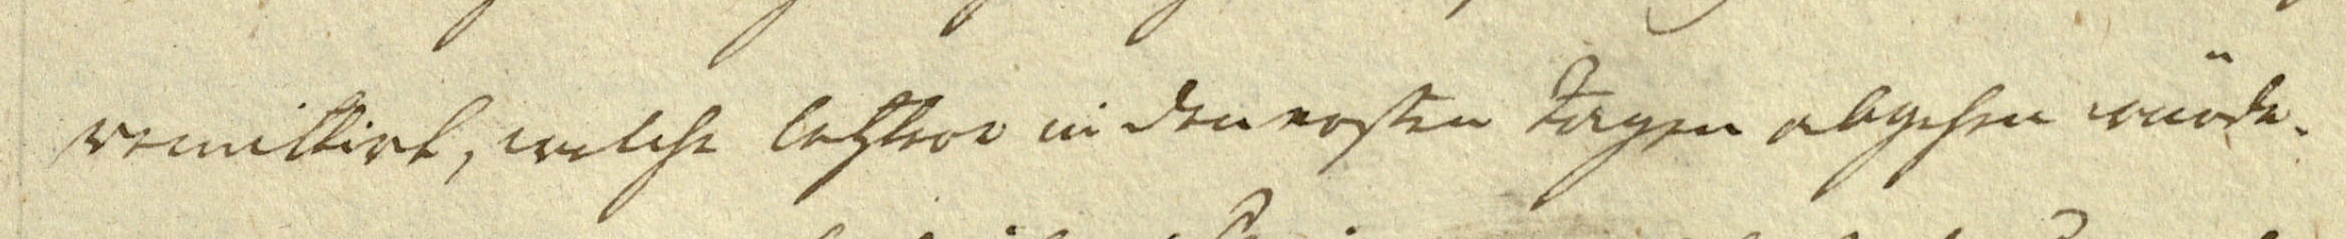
remittirt, welche letztere in den ersten Tagen abgehen würde.
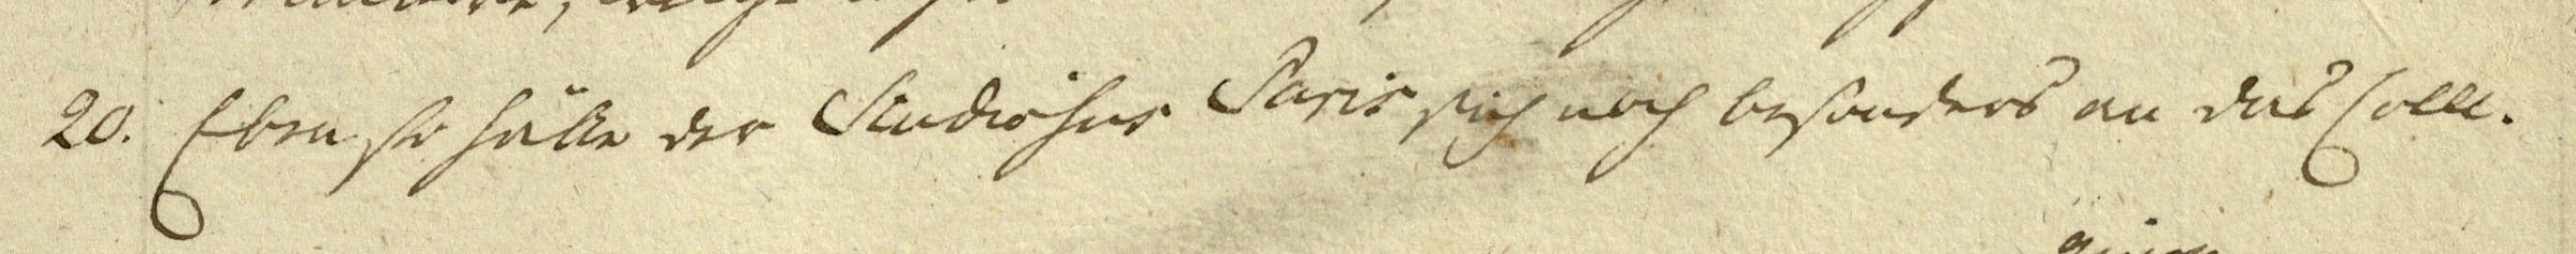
20. Eben so hätte der Studiosus Paris sich noch besonders an das Colle¬
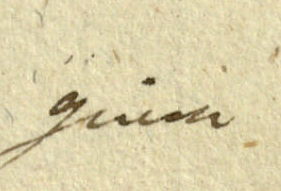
gium
